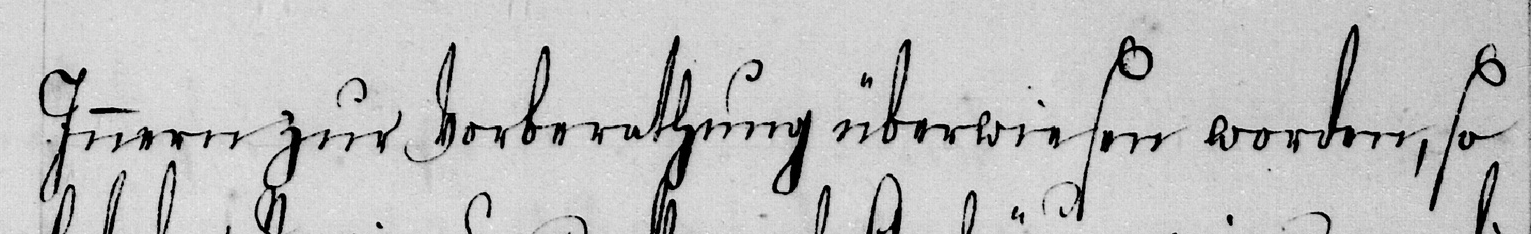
Innern zur Vorberathung überwiesen worden, so
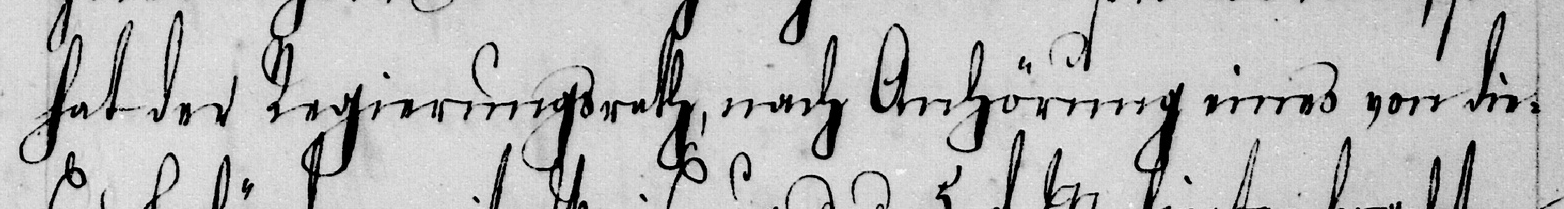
hat der Regierungsrath, nach Anhörung eines von die¬
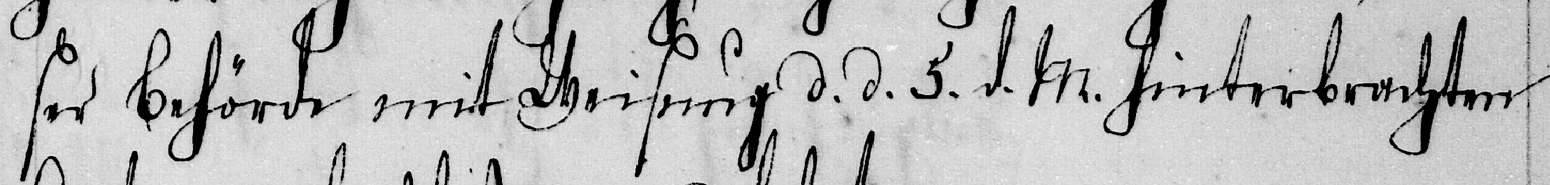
ser Behörde mit Weisung d. d. 5. d. M. hinterbrachten
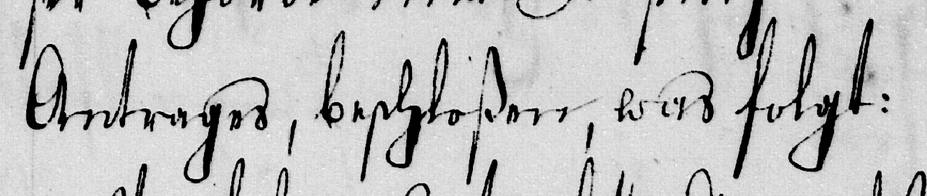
Antrages, beschloßen, was folgt:
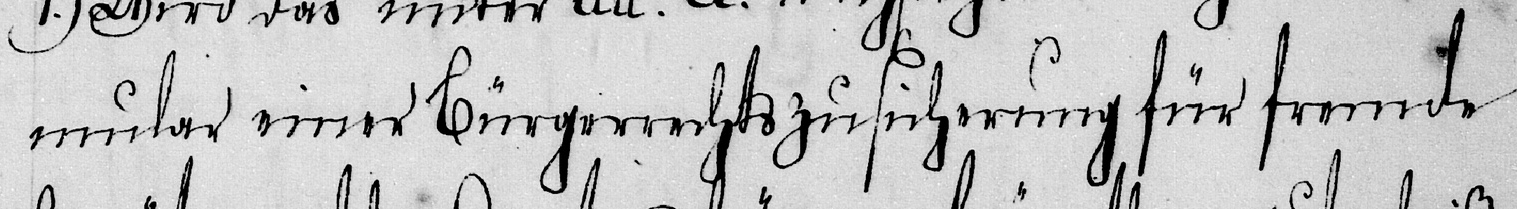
mular einer Bürgerrechtszusicherung für fremde
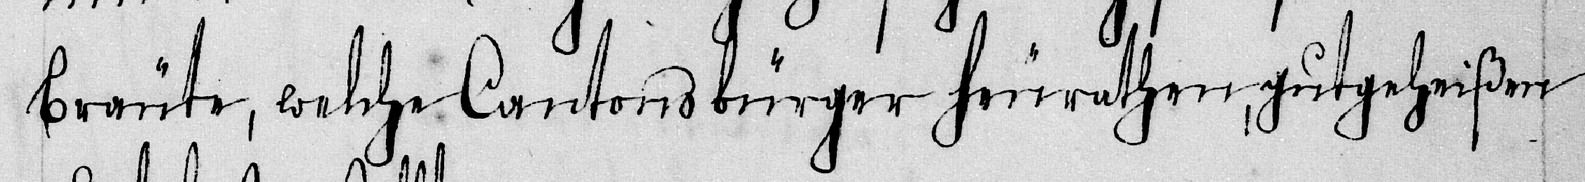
Bräute, welche Cantonsbürger heurathen, gutgeheißen
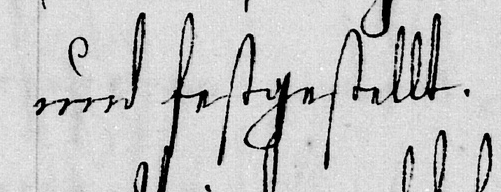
und festgestellt.
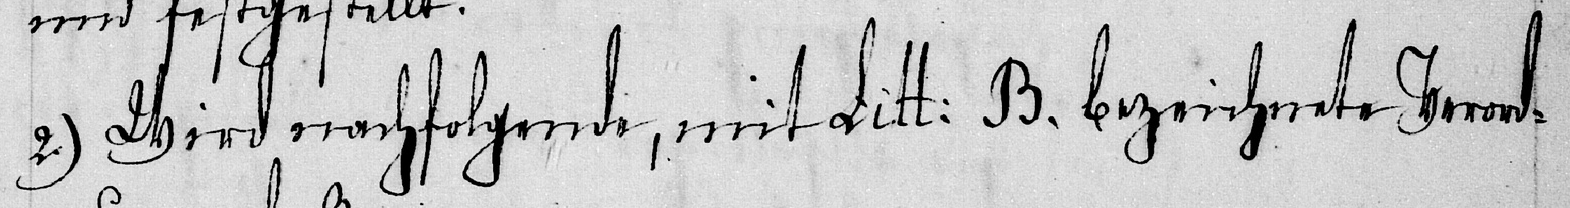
2.) Wird nachfolgende, mit Litt: B. bezeichnete Verord¬
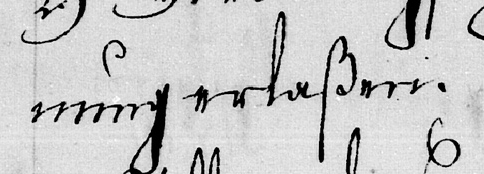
nung erlaßen.
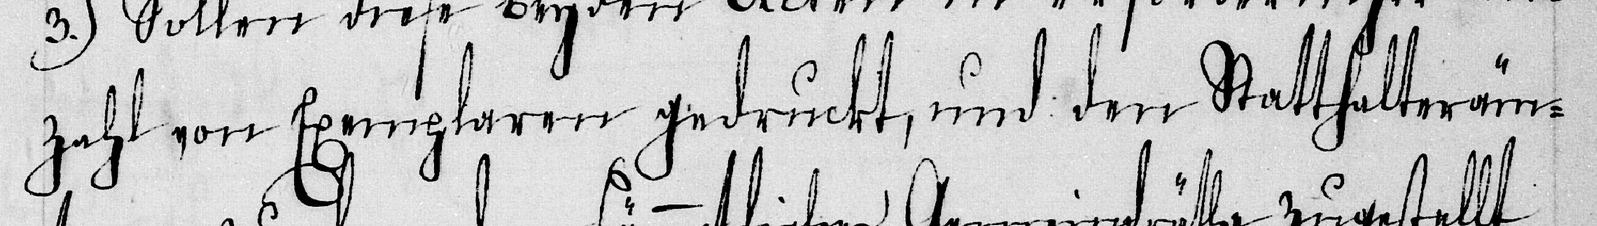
zahl von Exemplaren gedruckt, und den Statthalteräm¬
